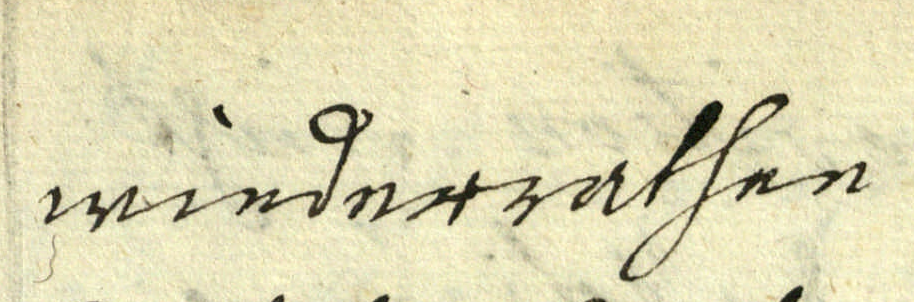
wiederrathen.
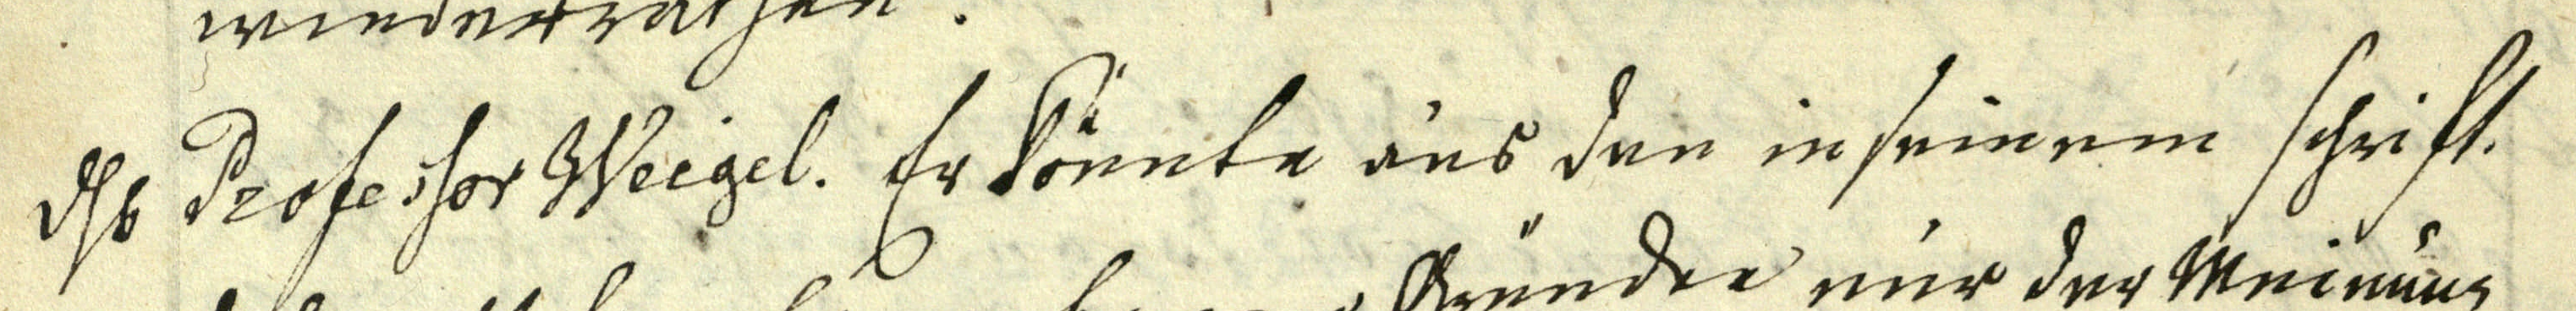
dh Professor Weigel. Er könnte aus den in seinem schrift¬
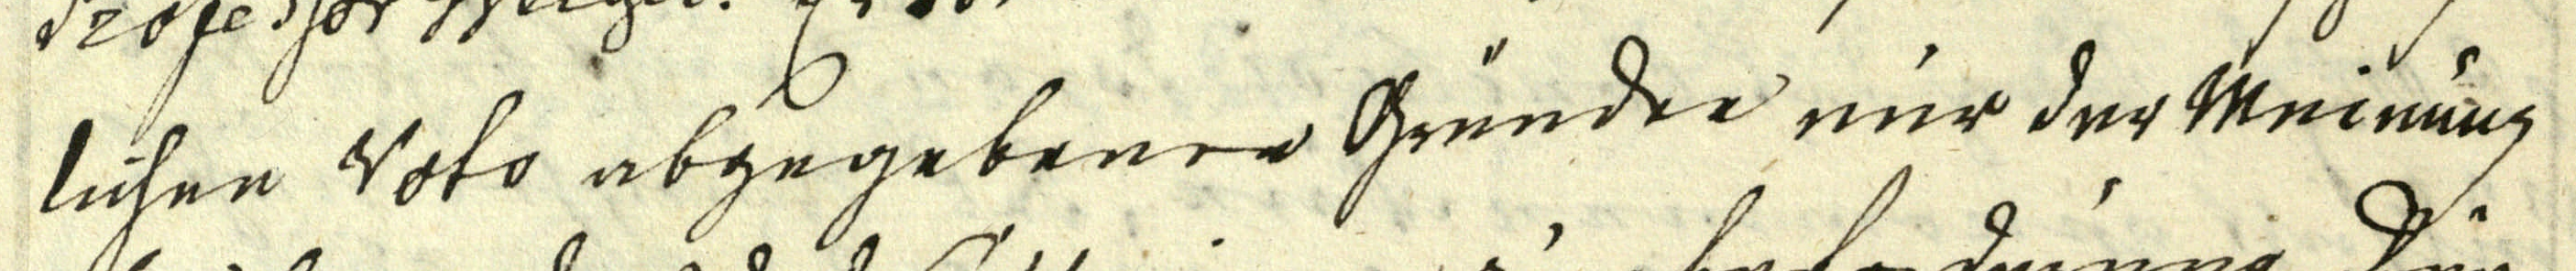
lichen Voto abgegebenen Gründen nur der Meinung
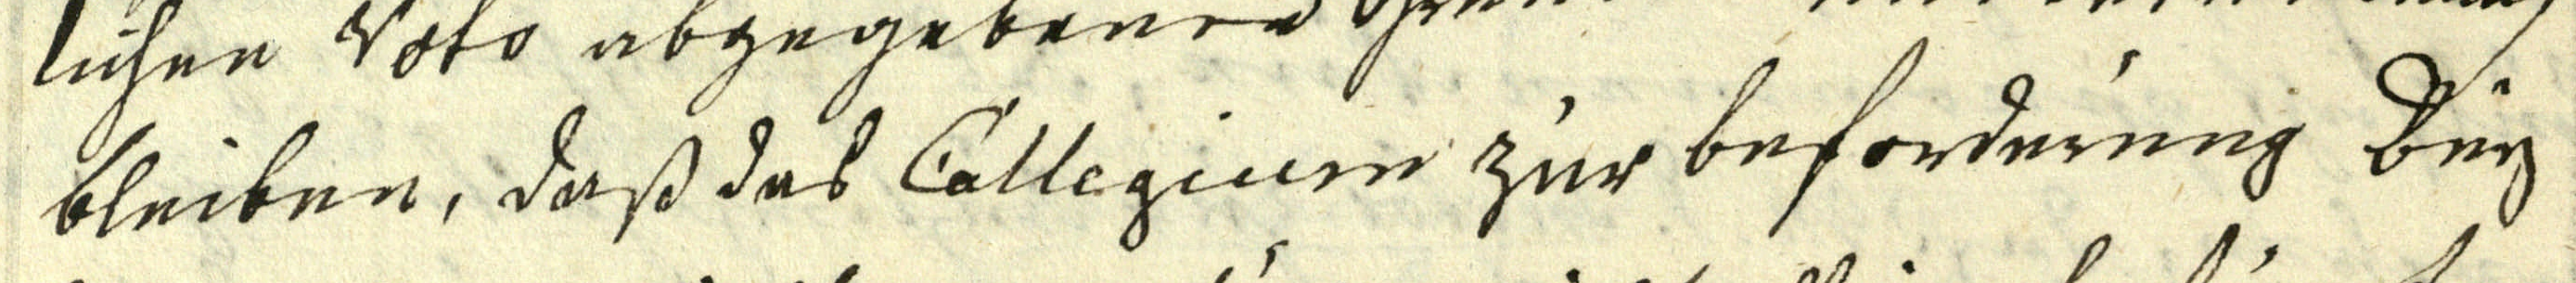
bleiben, daß das Collegium zur Beförderung beÿ
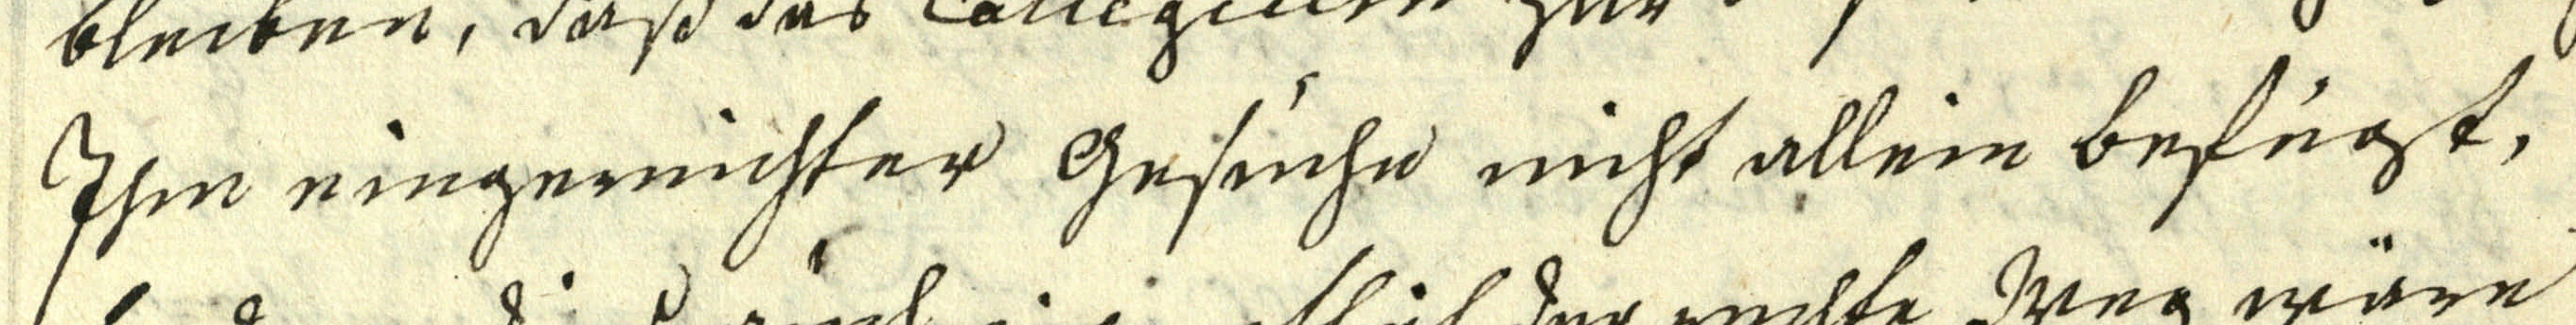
Ihm eingereichter Gesuche nicht allein befugt,
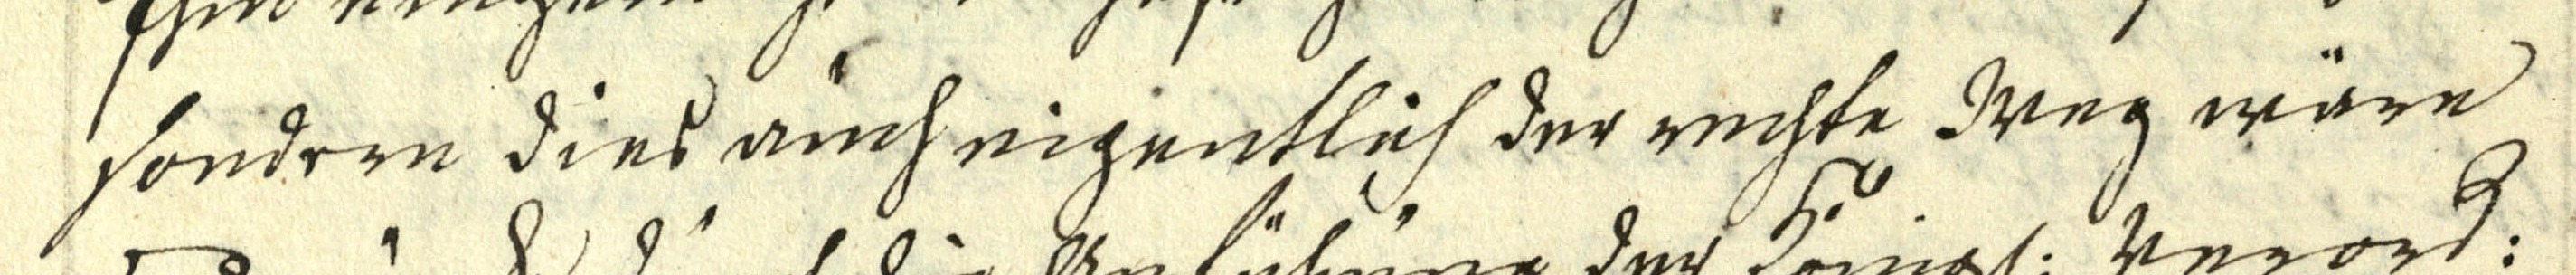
sondern dies auch eigentlich der rechte Weg wäre
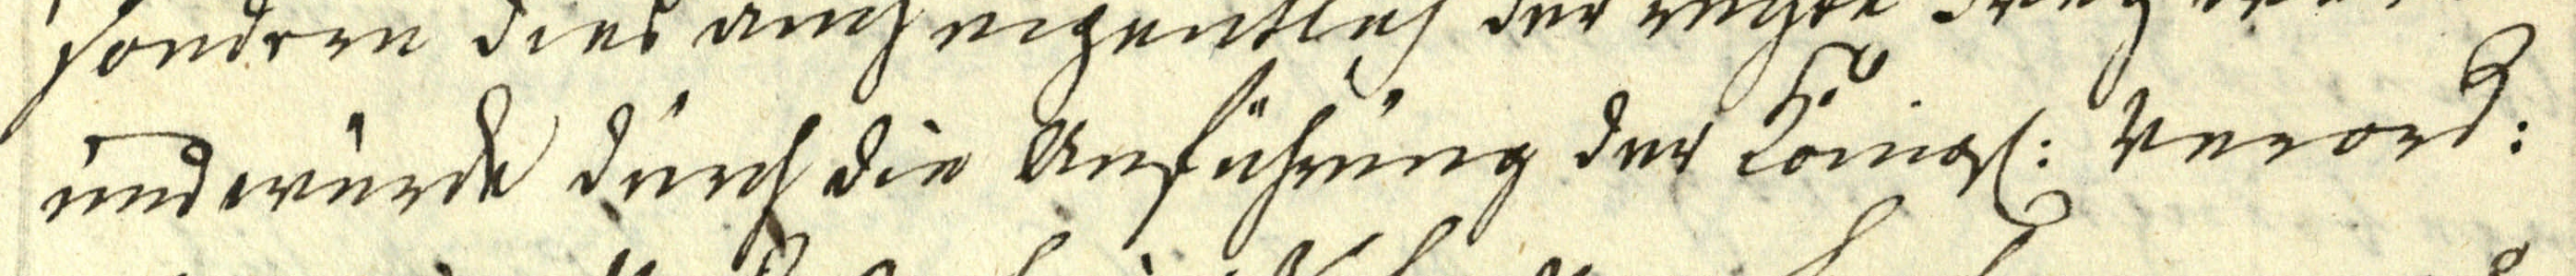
und würde durch die Anführung der Königl. Verord¬
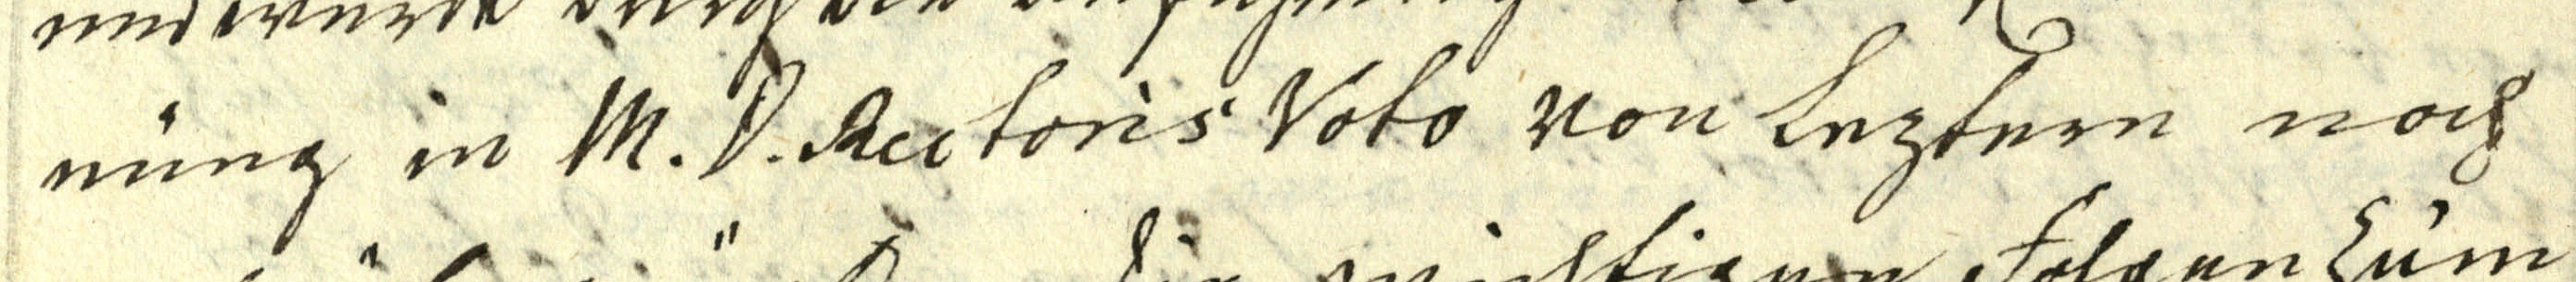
nung in M. D. Rectoris Voto von leztern noch
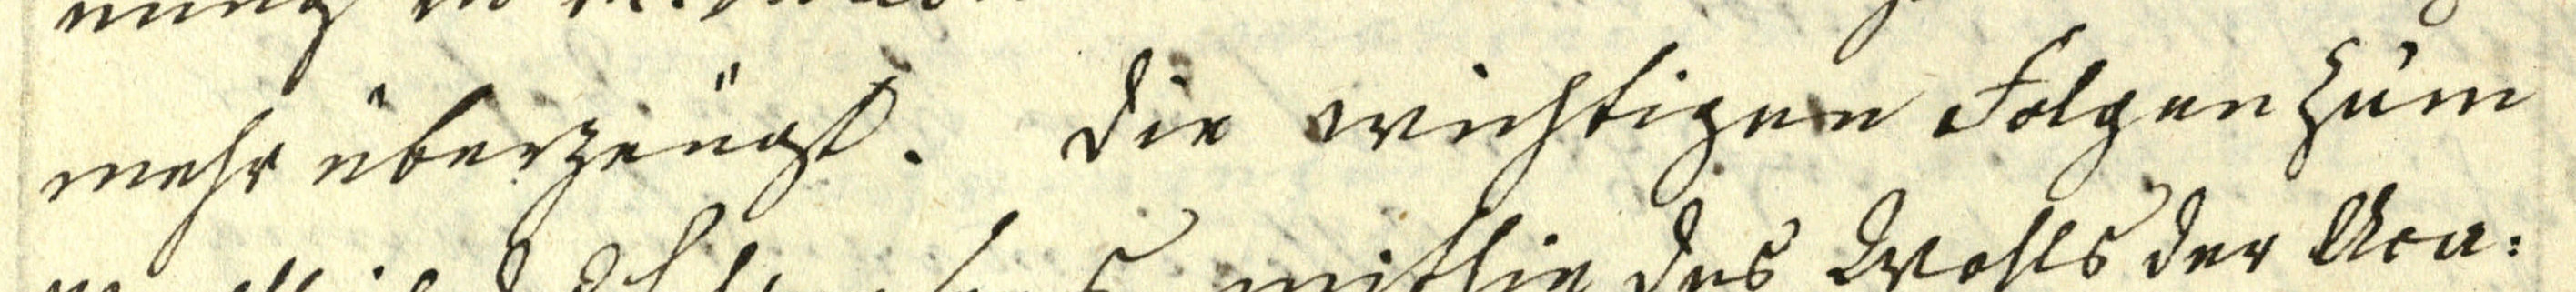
mehr überzeugt. Die wichtigen Folgen zum
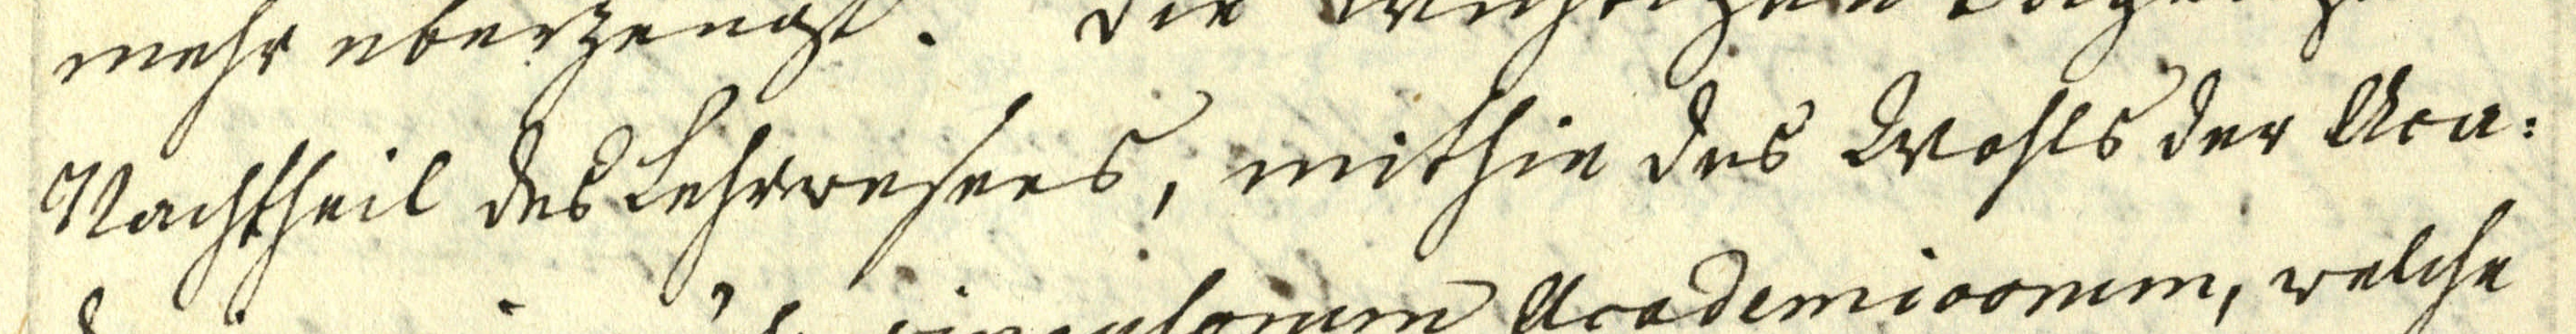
Nachtheil des Lehrwesens, mithin das Wohls der Aca¬
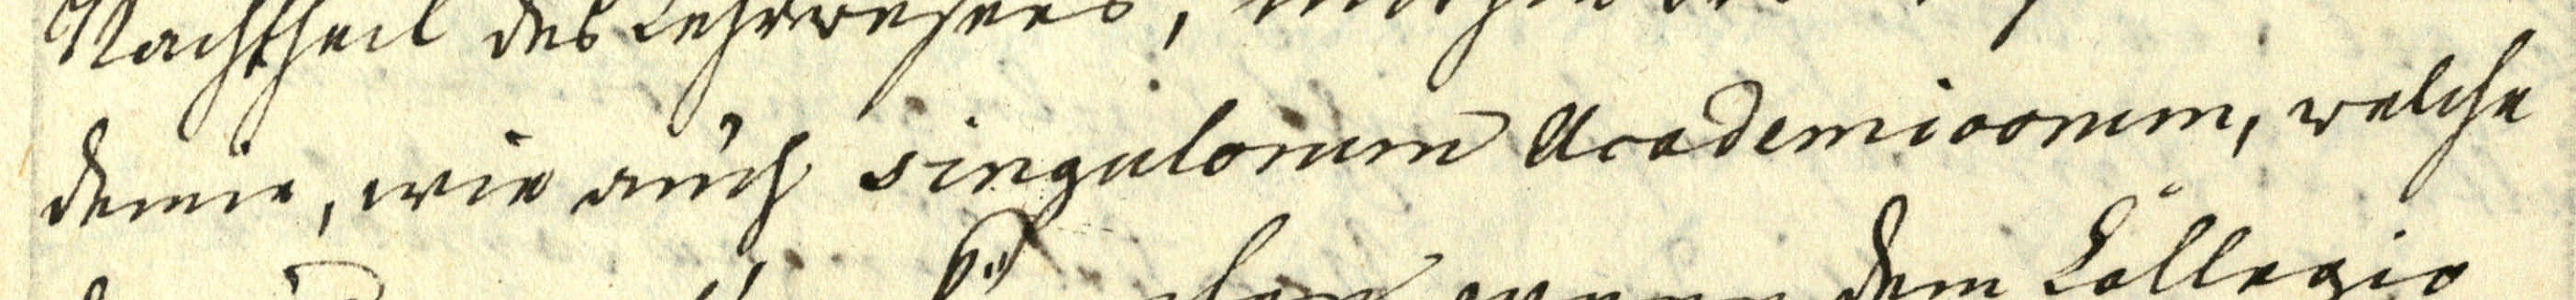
demie, wie auch singulorum Academicorum, welche
